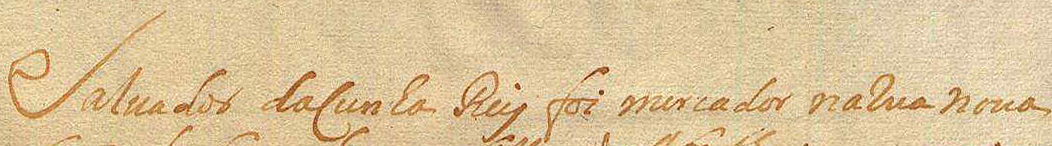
Saluador da Cunha Reis foi mercador na Rua noua
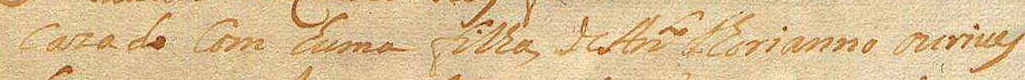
cazado com huma filha de Anto thorianno ouriues
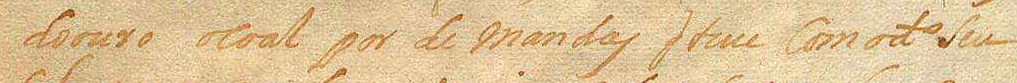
do ouro o coal por demandas q̄ teue Com o d̄o seu
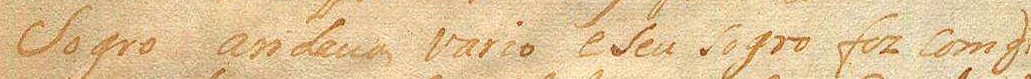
Sogro andaua vario e seu sogro fez com q̄
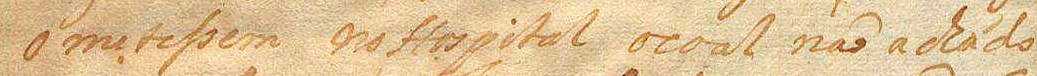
o metessem no Hospital o coal naõ achādo
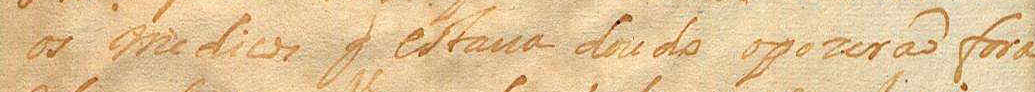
os médicos q̄ estaua doudo o pozeraõ fora
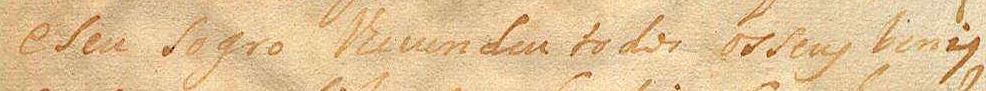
e seu sogro lhe uendeu todos os seus benis
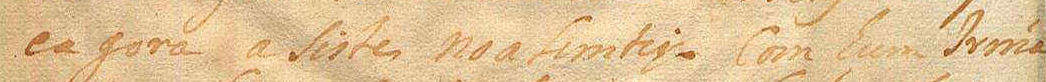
e agora asiste no alemteyo Com hum Irmã
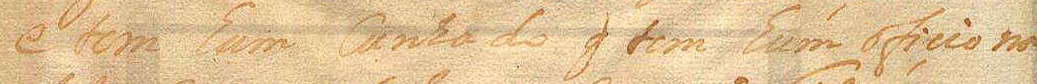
e tem hum Cunhado q̄ tem hum oficio na
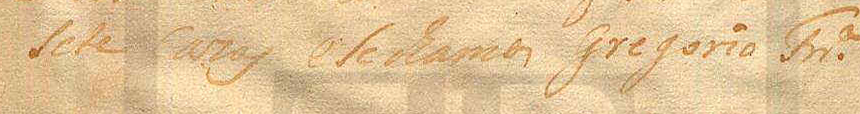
sete cazas e se chama Gregorio Frr.a
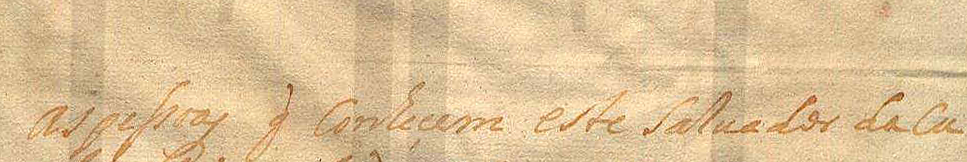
as pessoas q̄ conhecem este saluador da cu
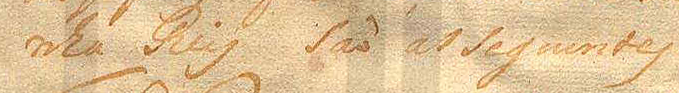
nha Reis saõ as seguintes
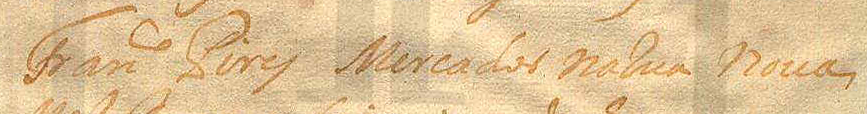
Franco Pires Mercador na Rua noua
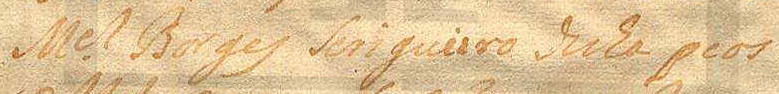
M.el Borges Serigueiro de chapeos
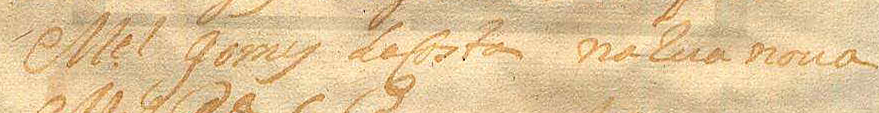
M.el gomes da Costa na Rua noua
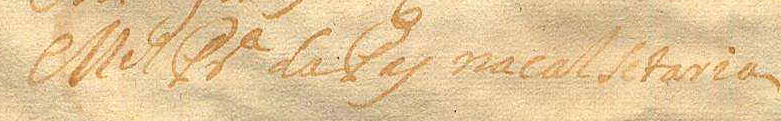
Mel Pra da Pas na calsetaria
